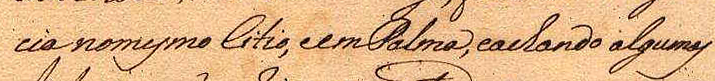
cia no mesmo Citio, e em Palma, e achando algumas
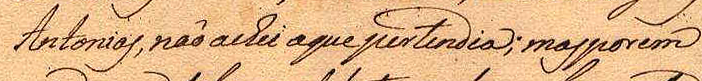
Antonias, naõ achei a que pertendia; mas porem
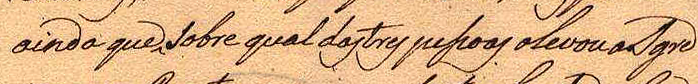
ainda que sobre qual das tres pessoas o levou a Igre
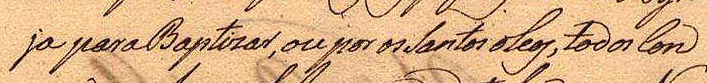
ja para Baptizar, ou por os Santos oleos, todos Con
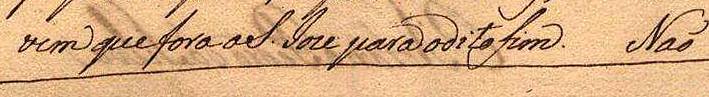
vem que fora a S. Ioze para o dito fim. Naõ
